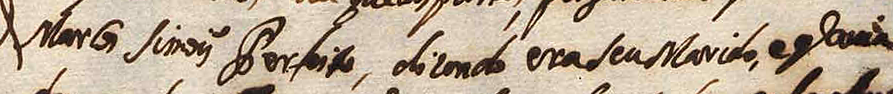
MarCos simoes̄ Perfeito, dizendo era seu Marido, e q̄ auia
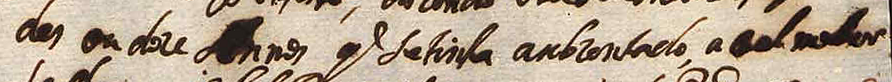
des ou doze Annos q̄ se tinha aubzentado, a tal molher
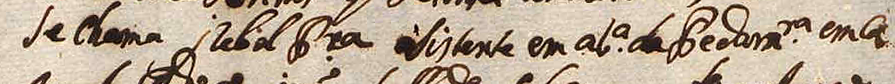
se chama JZabel P.ra aSistente em a V.a da Pedern.ra em ca
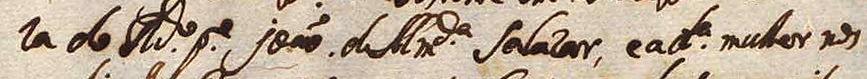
za do Rdo p.e, joaõ de Alm.da Salazar, e a d̄.a mulher nos
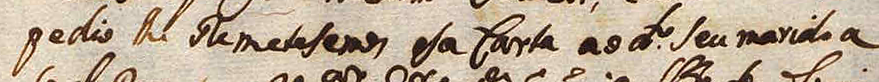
pedio lhe Remetesemos esa Carta ao d̄.o seu marido a
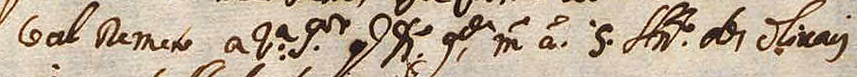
Coal Remeto a V.a S.as q̄ D.s g.de m̄ ā. S. An.to dos Oliuais
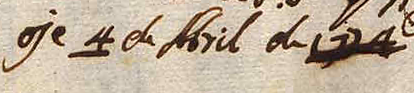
oje 4 de Abril de 1724
